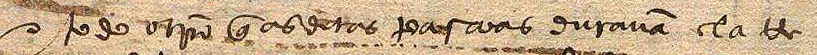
e todo o tpō q̄ as ditas Pascoas durauā ela Re
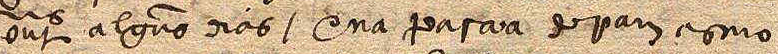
outros algūs dias / e na Pascoa do pam asmo
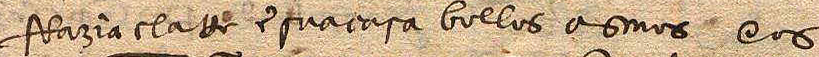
ffazia ela Re ē sua casa bollos asmos e os
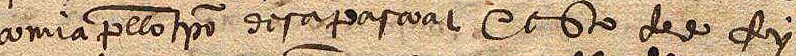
comia p̄llo tpō desa Pascoa / e esto todo foy
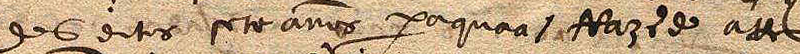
dos ditos sete an̄os ꝑa quaa / ffazēdo a Re
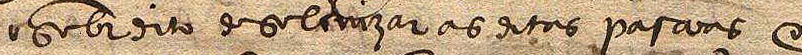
o s̄obrdito de solēnizar as ditas pascoas e
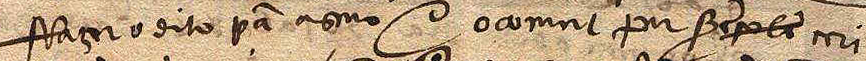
ffazer o dito pā asmo e o comer / por ꞩē solē ceri
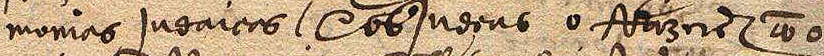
monias Judaicas / e os Judeus o ffazerē / c̄o o
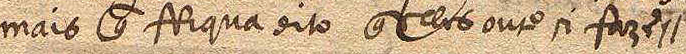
mais q̄ ffiqua dito q̄ elles outo si fazē //
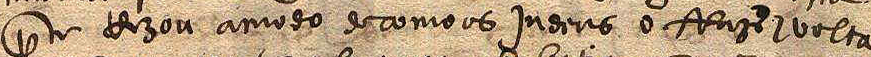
p̄te Rezou a modo de como os Judeus o ffazē / volta
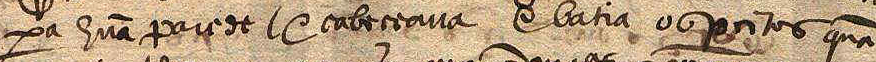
ꝑa huā parede / e cabeceaua e batia os peitos q̄ua
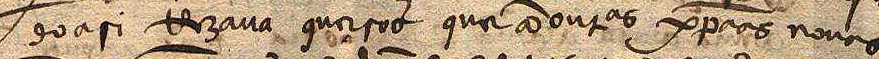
do asi Rezaua quer soo quer c̄o outas xpāas nouas
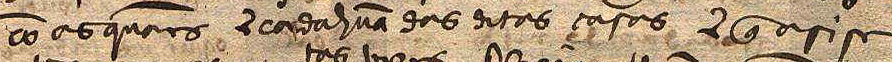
c̄o as qūaes ē cada hūa das ditas casas ē q̄ asi se
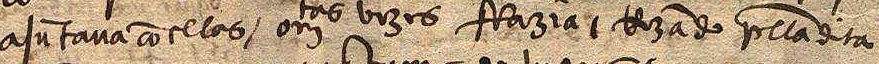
aJūtaua c̄o ellas / o mtas vezes ffazia / Rezādo p̄lla dita
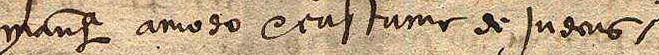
manra a modo e custume de Judeus /
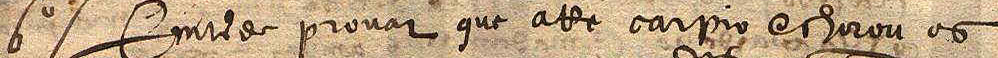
6o / Emtēde prouar que a Re carpio e chorou os
